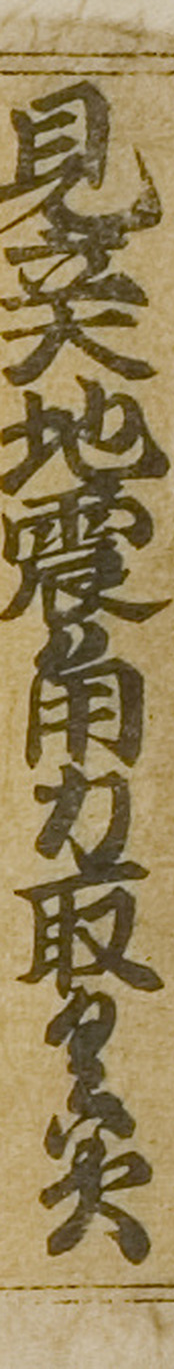見立大地震角力取くみ
